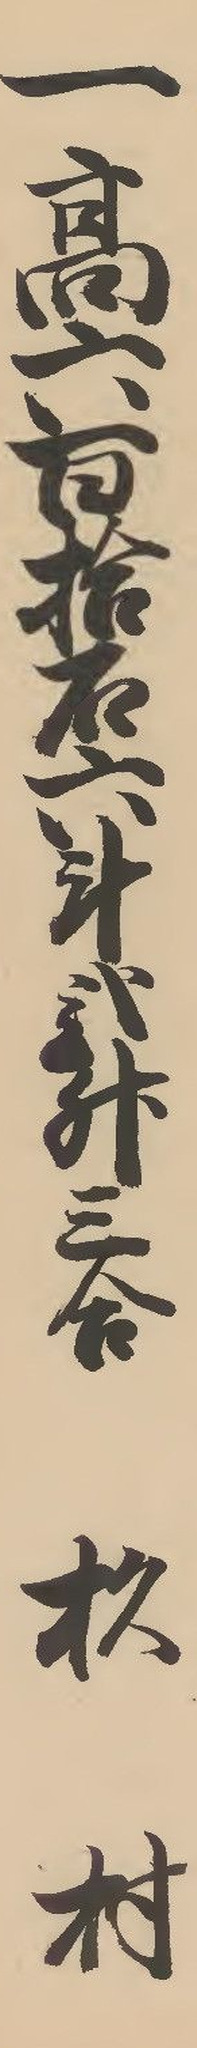一髙六百拾石六斗弐升三合杦村

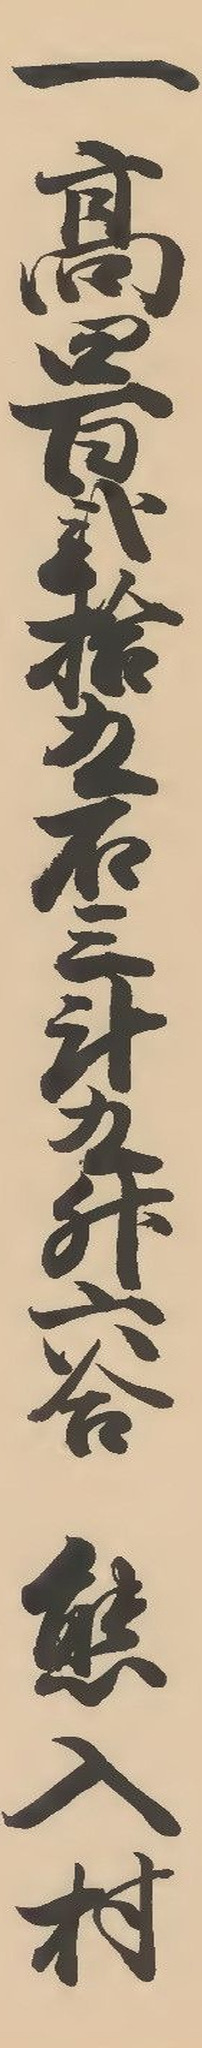一髙四百弐拾九石三斗九升六合熊入村
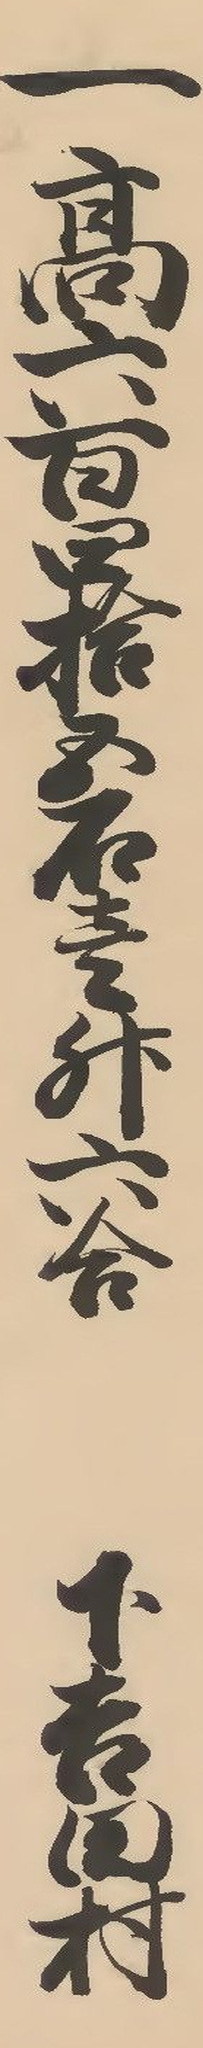一髙六百四拾五石壱升六合下吉田村
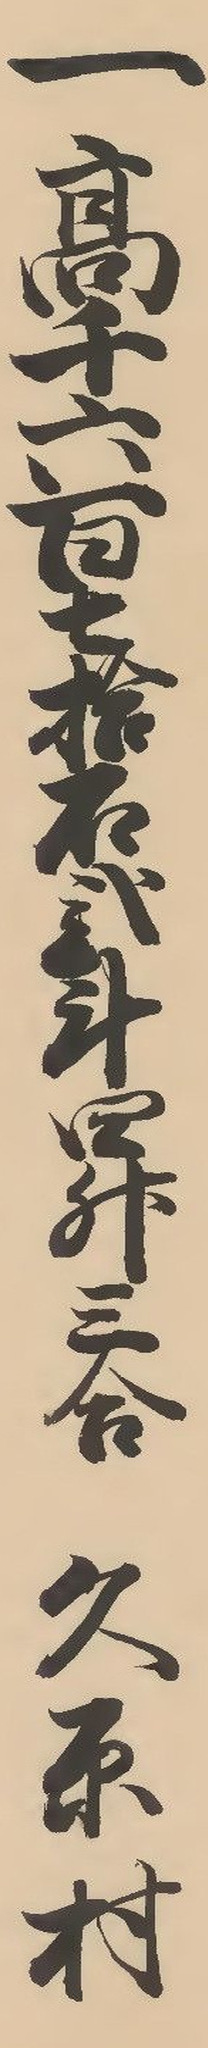一髙千六百七拾石弐斗四升三合久原村
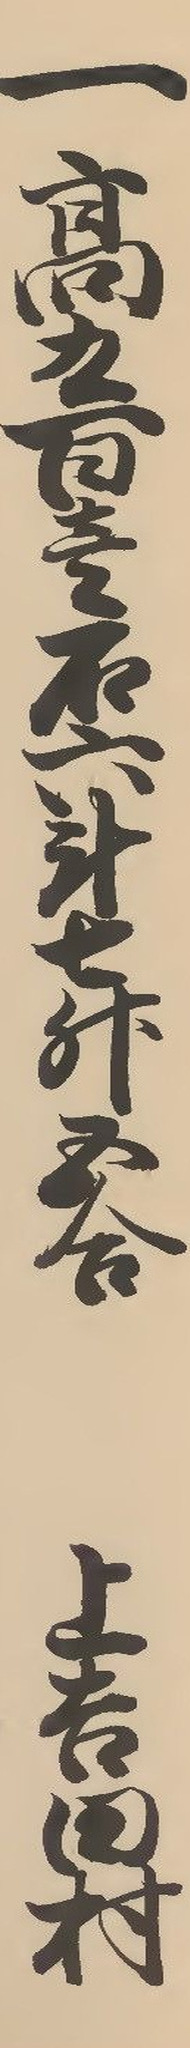一髙九百壱石六斗七升五合上吉田村
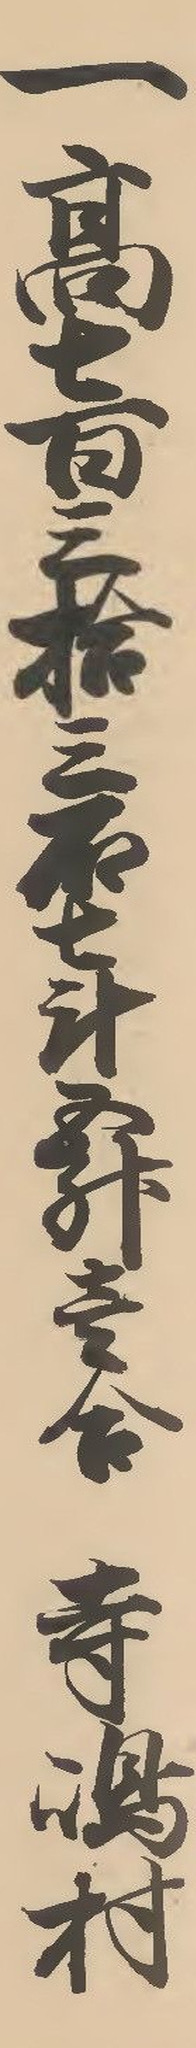一髙七百三拾三石七斗五升壱合寺嶋村
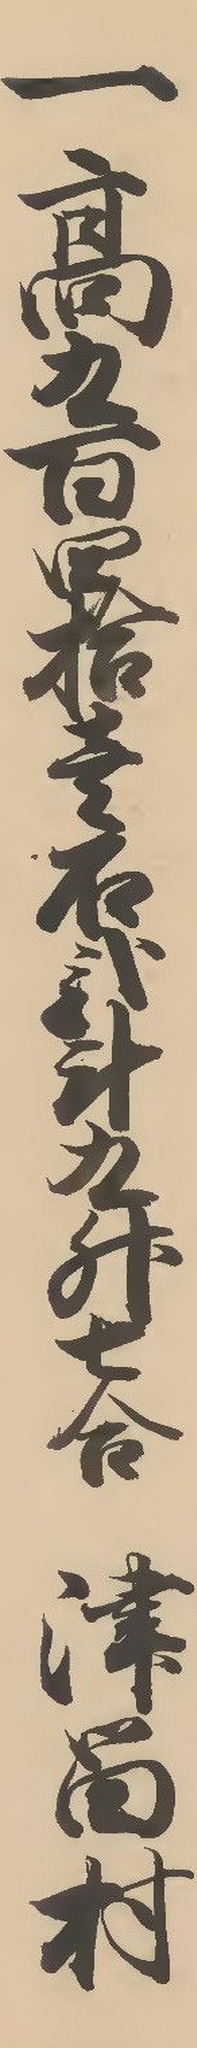一髙九百四拾壱石弐斗九升七合津留村
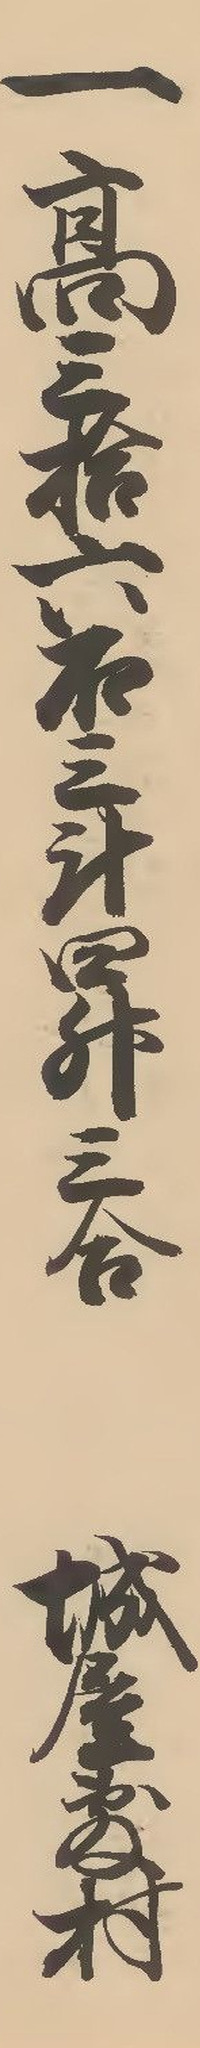一髙三拾六石三斗四升三合城屋敷村
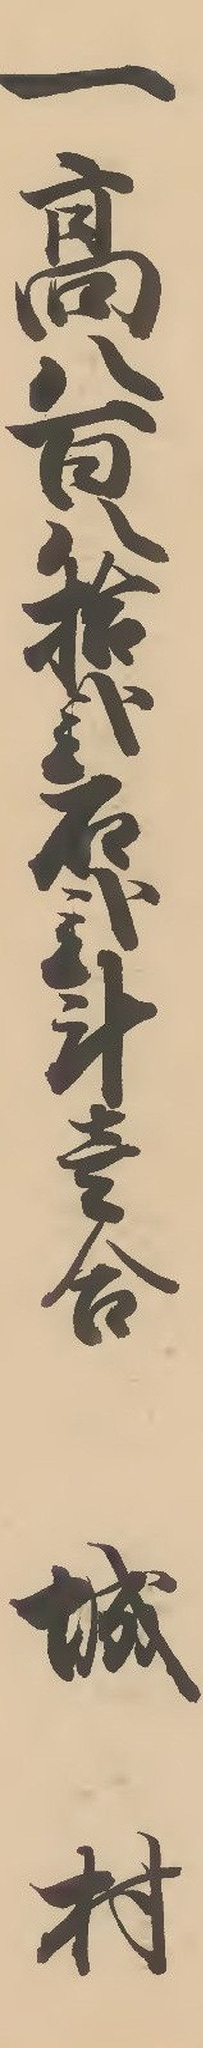一髙八百八拾弐石弐斗壱合城村

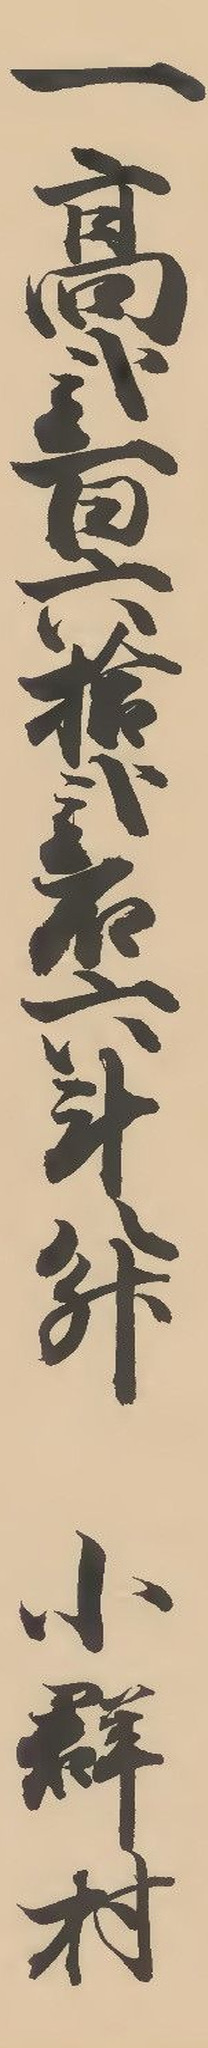一髙弐百六拾弐石六斗八升小群村
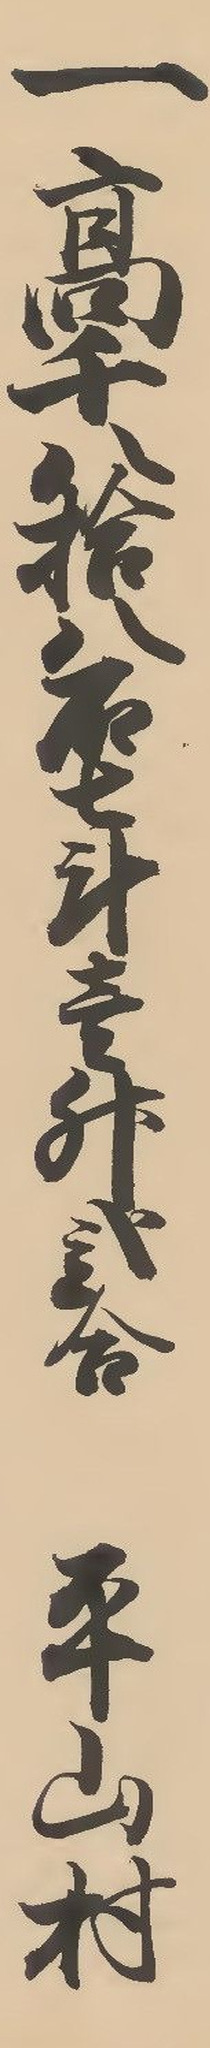一髙千八拾八石七斗壱升弐合平山村
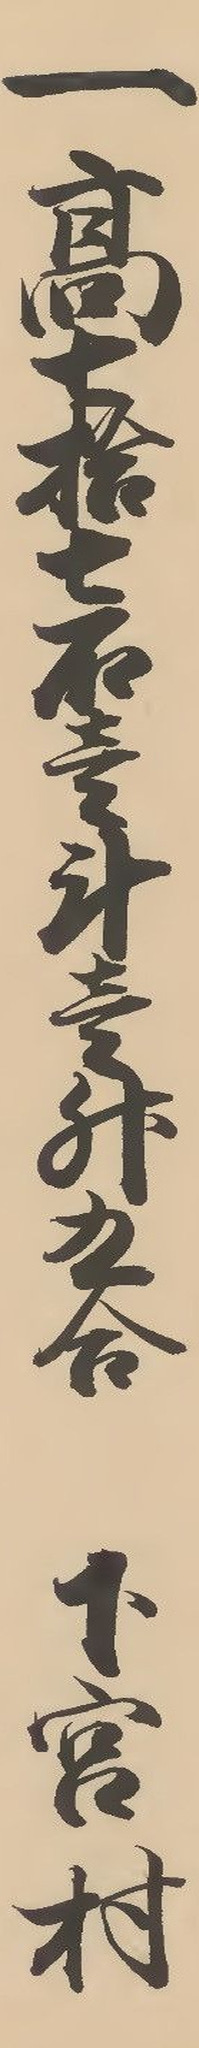一髙七拾七石壱斗壱升九合下宮村
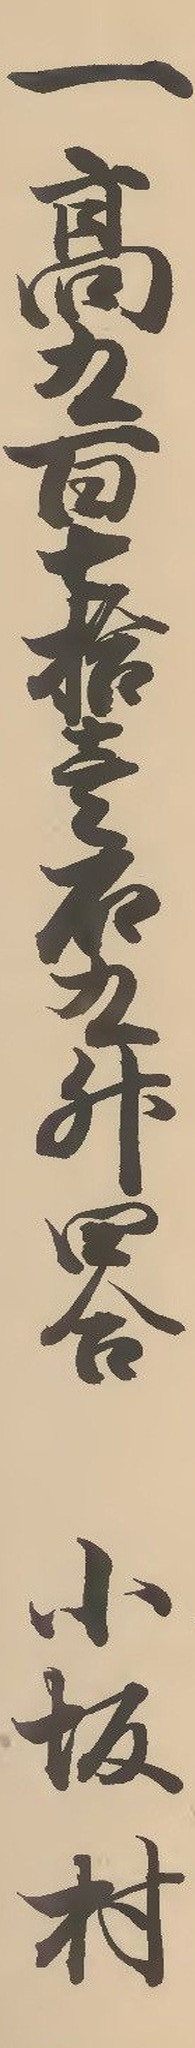一髙九百七拾壱石九升四合小坂村
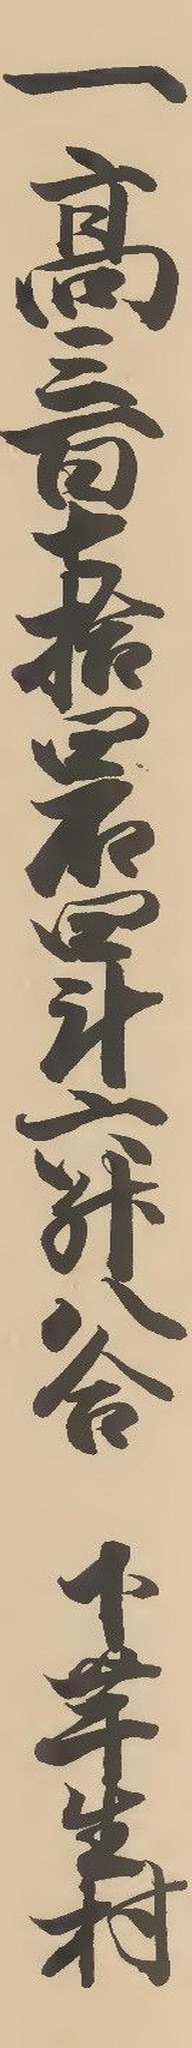一髙三百七拾四石四斗六升八合下芋生村
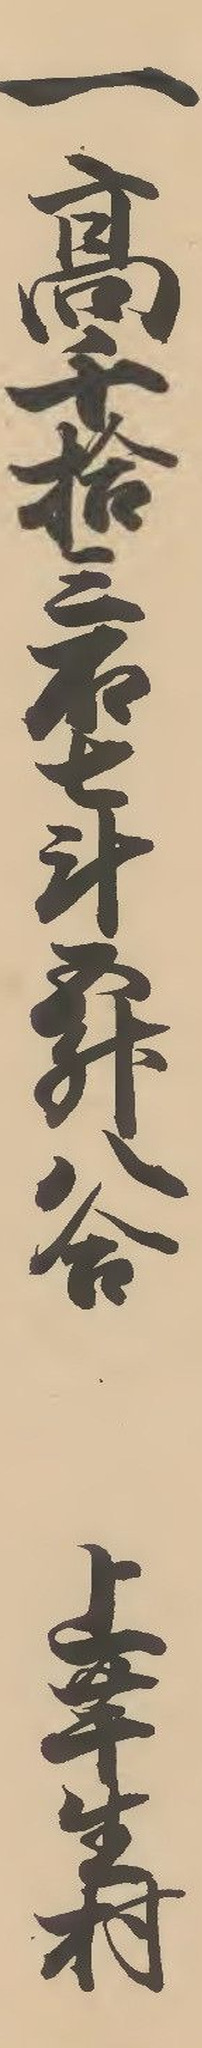一髙千拾三石七斗五升八合上芋生村
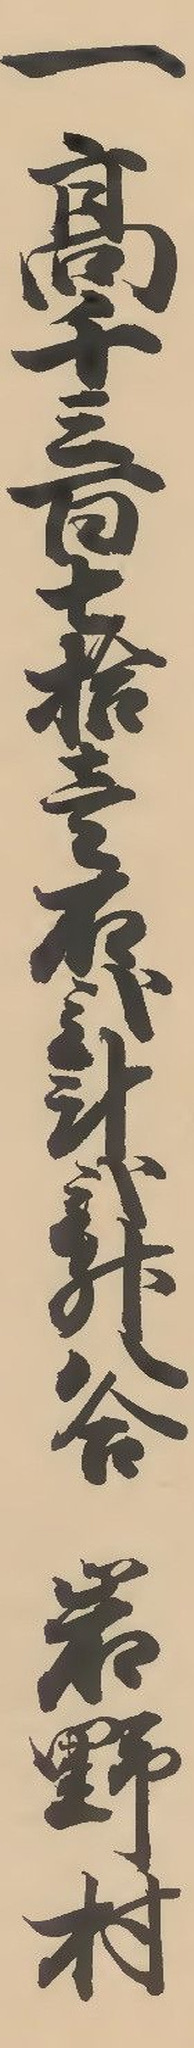一髙千三百七拾壱石弐斗弐升八合岩野村
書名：肥後国郷帳
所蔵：国立公文書館 National Archives of Japan
